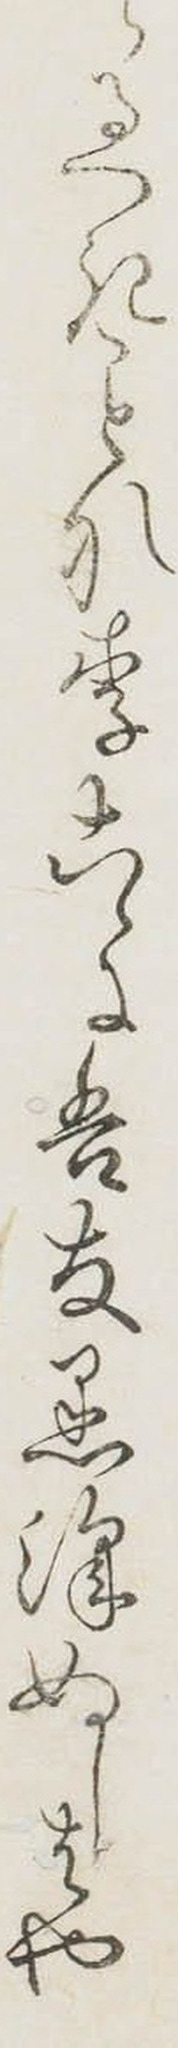もしらるへきことなりこゝに吾友黒沢ぬしはや
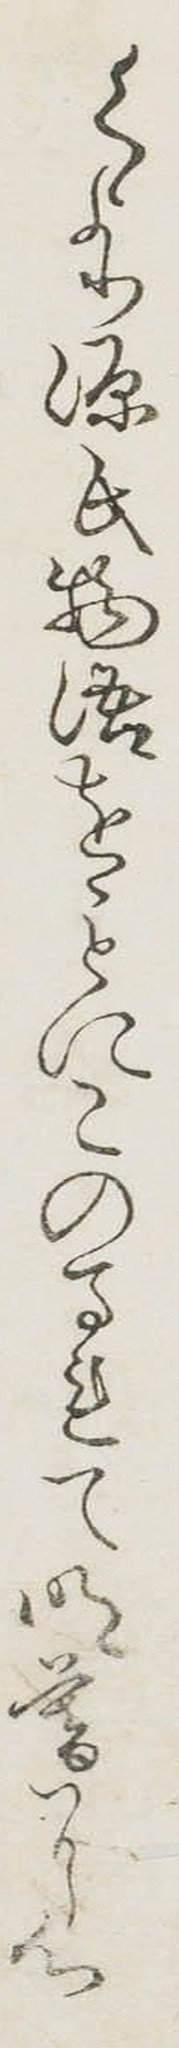くより源氏物語をことにこのまれて明暮に心
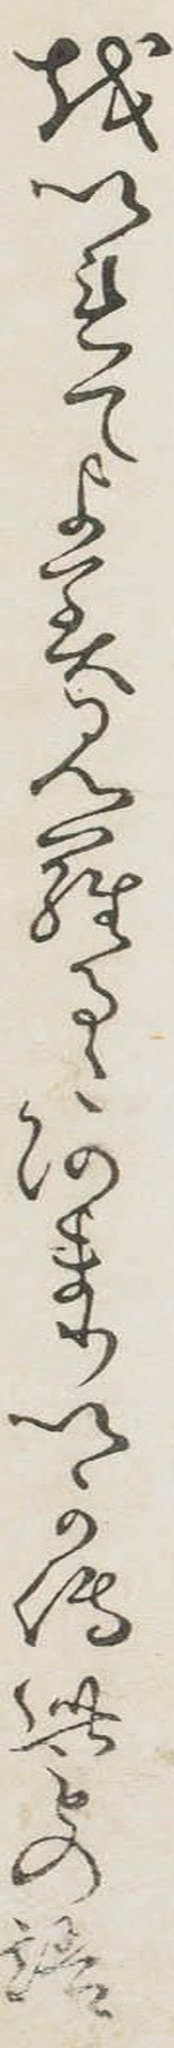をいれてよみ見らるゝあまりいかて此もの語

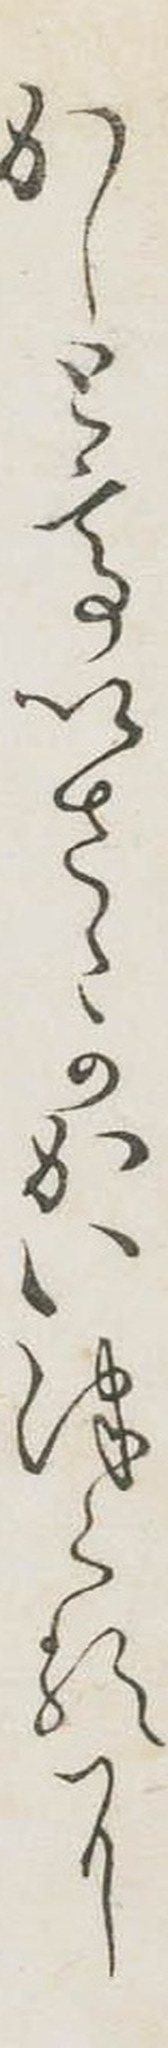かしとていさゝかかいつくるに
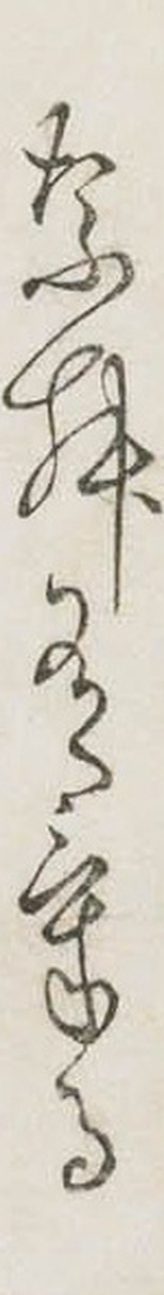なむ有ける
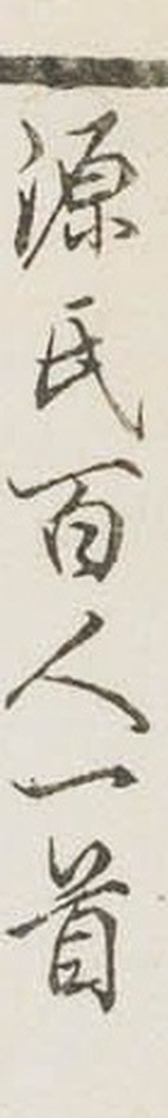源氏百人一首
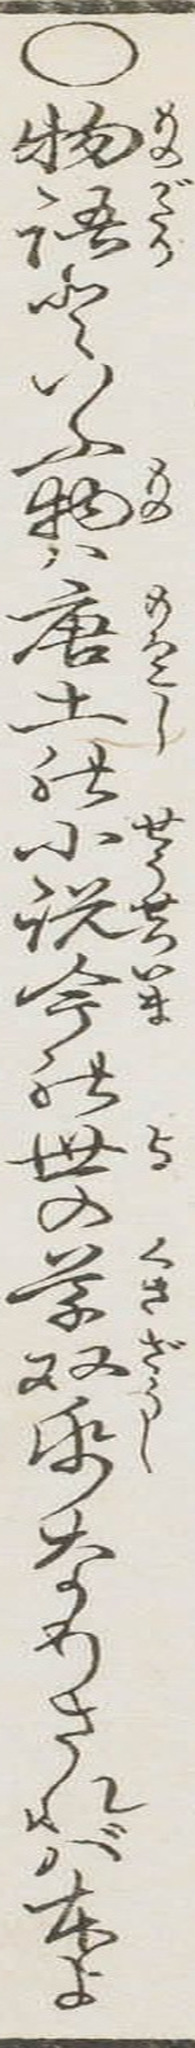○物語といふ物は唐土の小説今の世の草双紙なりされば本よ
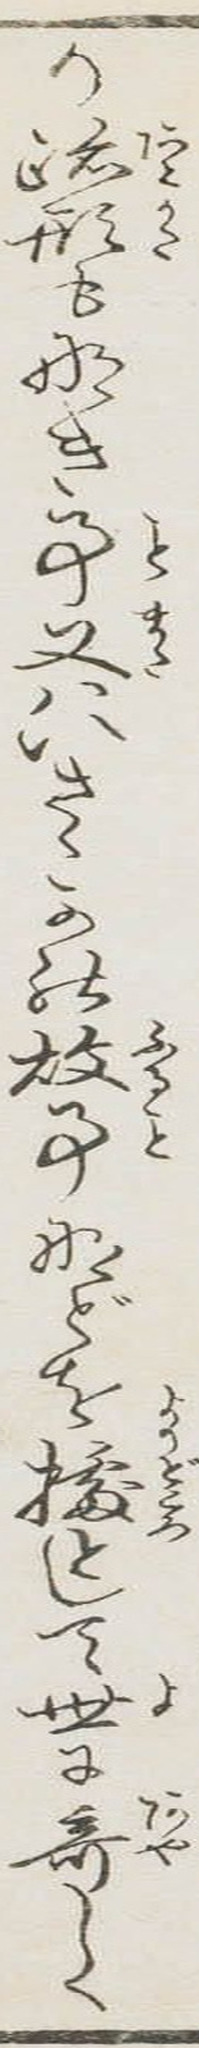り跡形もなき事又はいさゝかの故事などを拠として世に奇しく
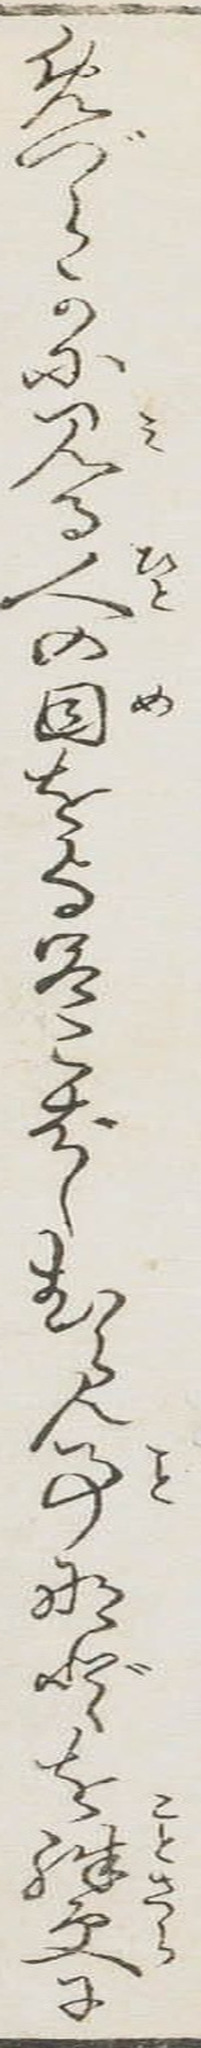めづらかに見る人の目をよろこばしむらん事などを殊更に
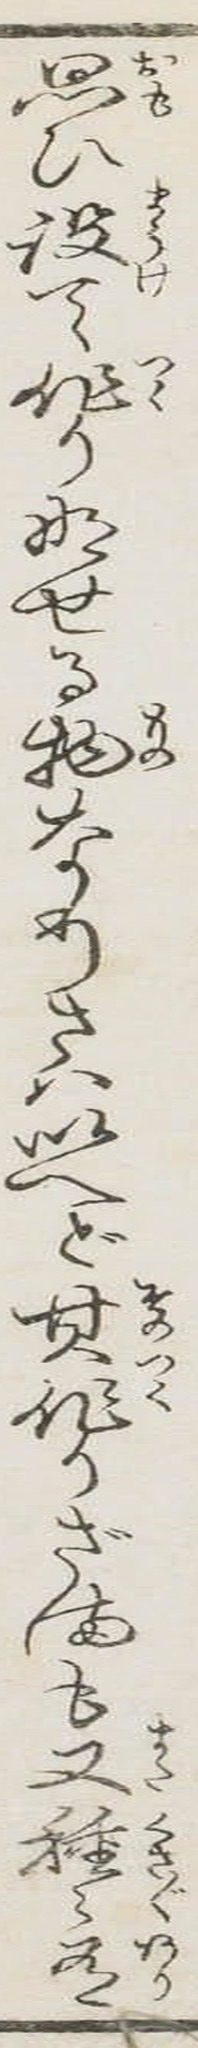思ひ設て作りなせる物なりさはいへど其作りざまも又種々有
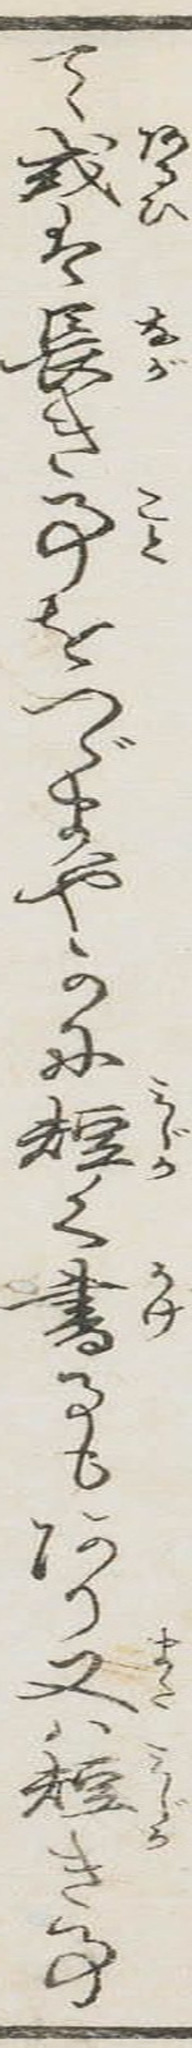て或は長き事をつゞまやかに短く書るもあり又は短き事
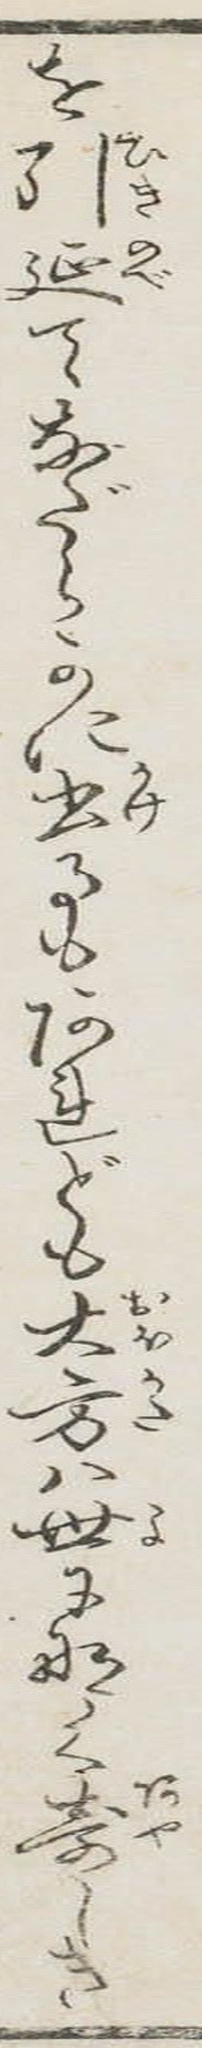を引延てなだらかに書るもあれども大方は世になく奇しき
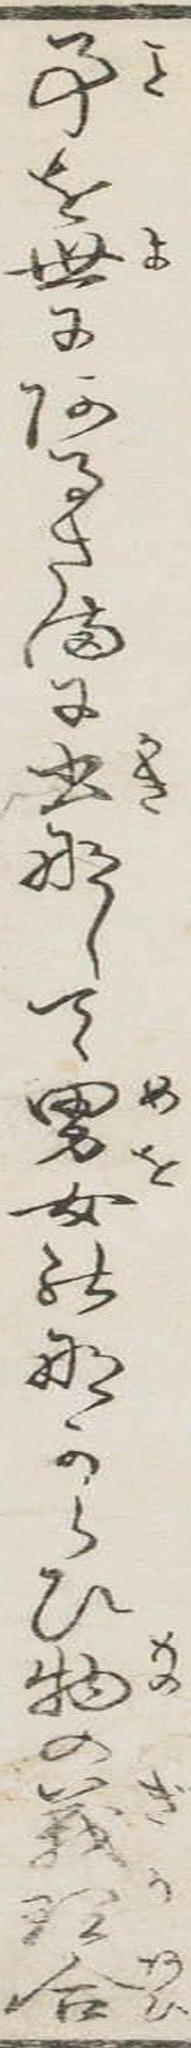事を世にあるさまに書なして男女のなからひ物の義理合
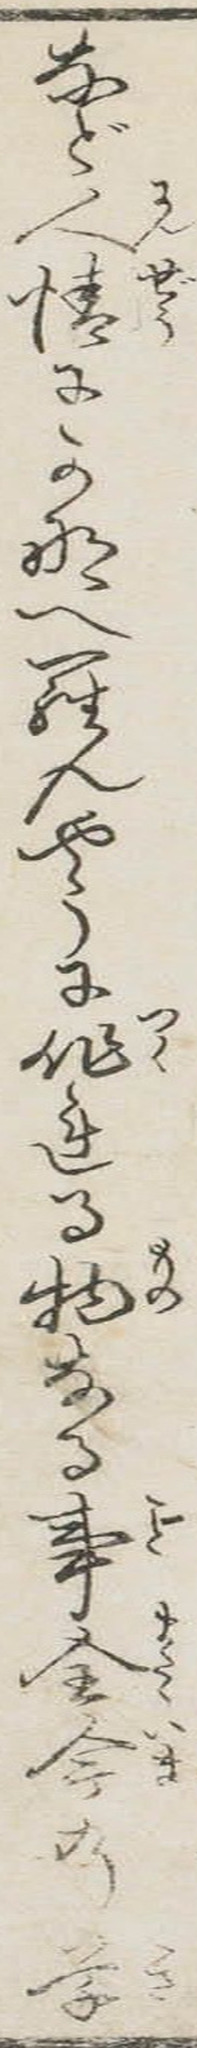など人情にかなへらんやうに作れる物なる事全今の草
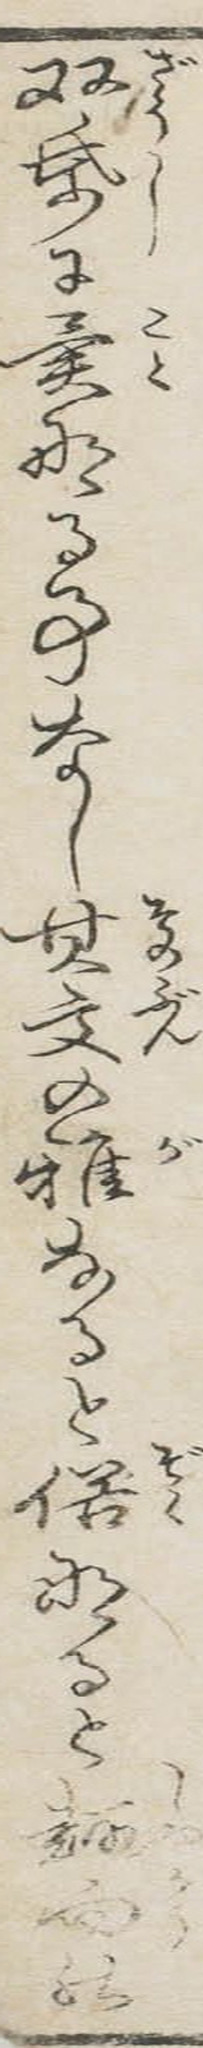双紙に異なる事なし其文の雅なると俗なると趣向の

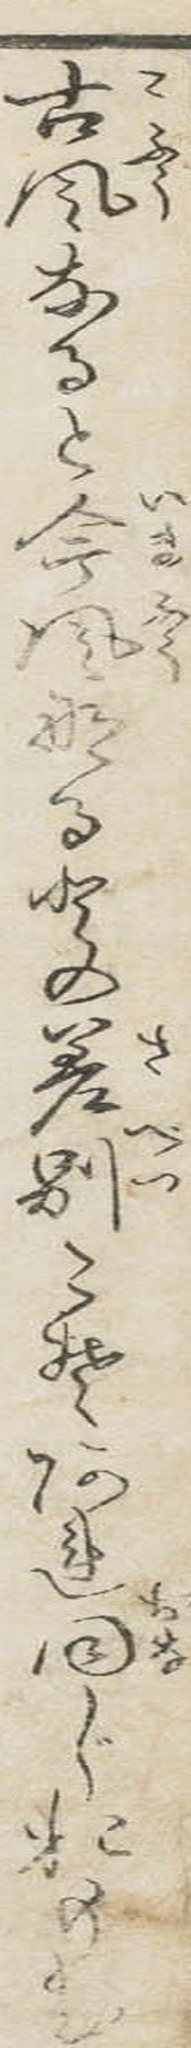古風なると今風なるとの差別こそあれ同じおもむき
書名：源氏百人一首
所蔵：東京学芸大学教育コンテンツアーカイブ
